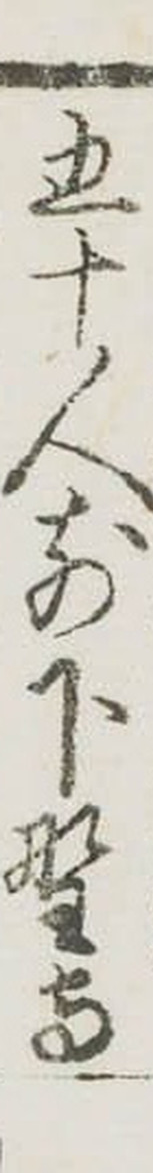五十人前下野守
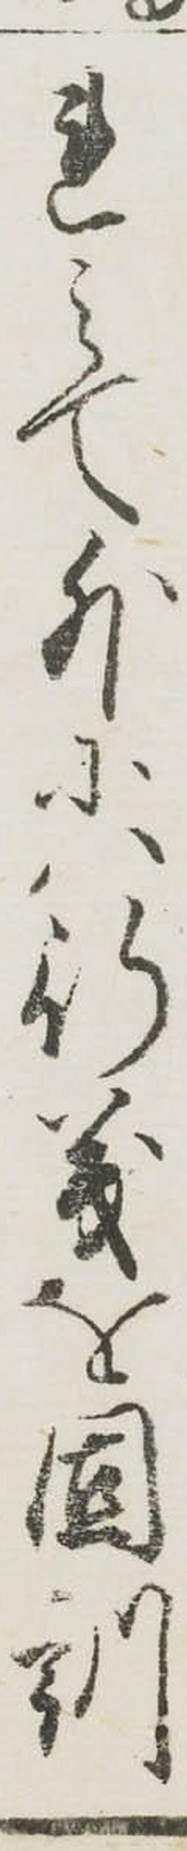れみて外には行義を固訓
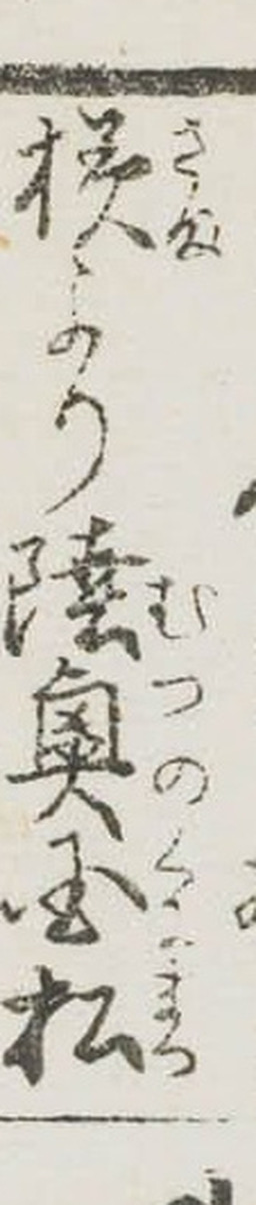様より陸奥国松
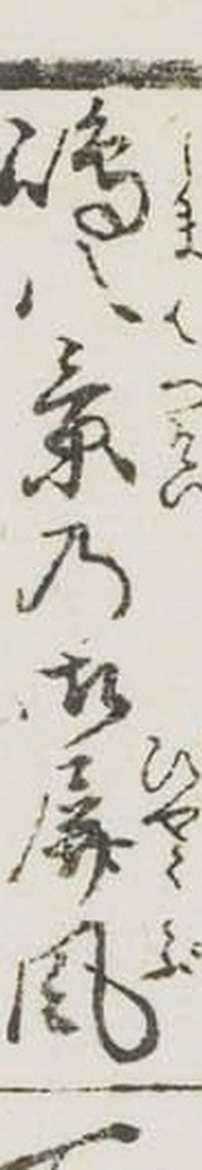嶋八景の御屏風
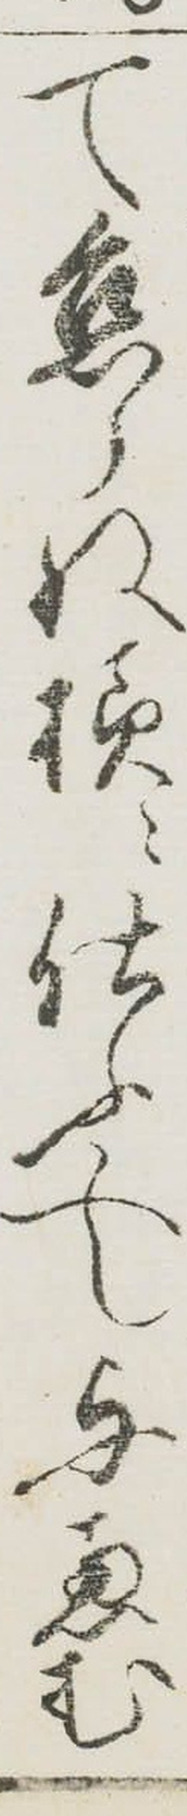て怠らぬ様仕ふへし与恵む
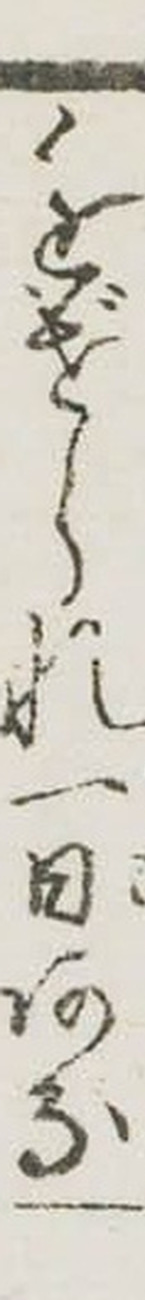進ぜられ一日あな
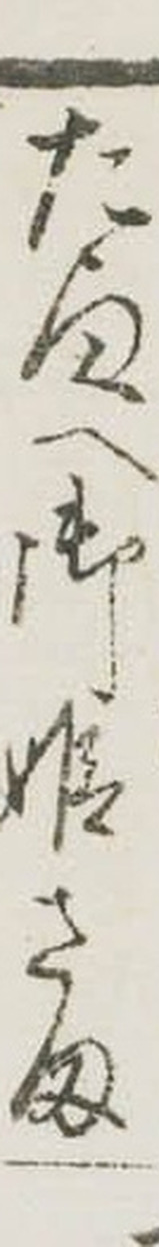たさまへ御姫さま
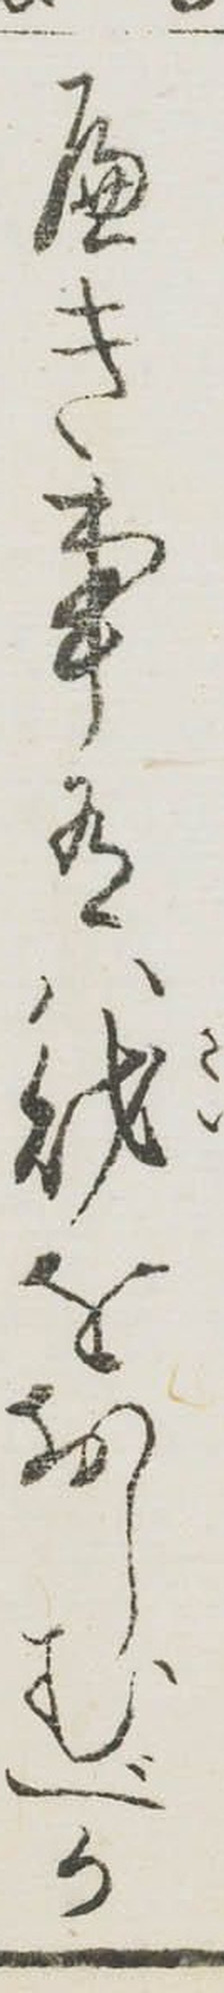へき事有は財をおしむべか
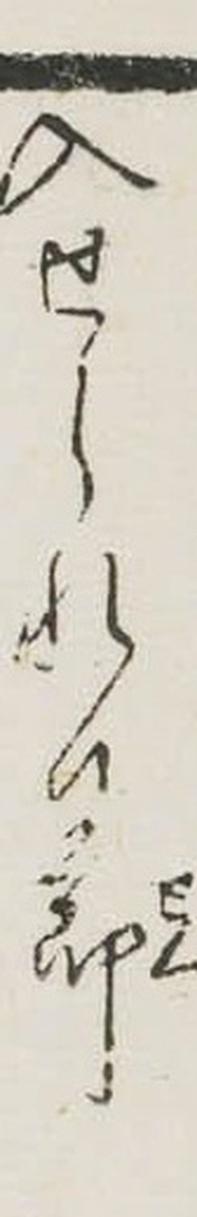入せられ候節
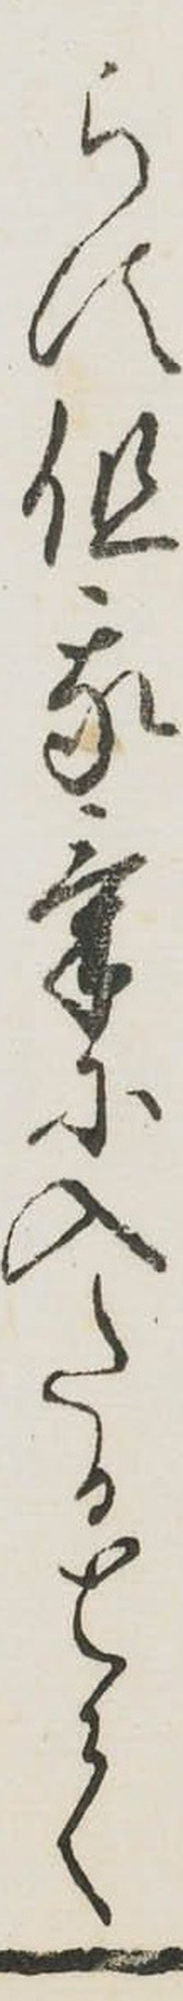らす但我気に入たるとて
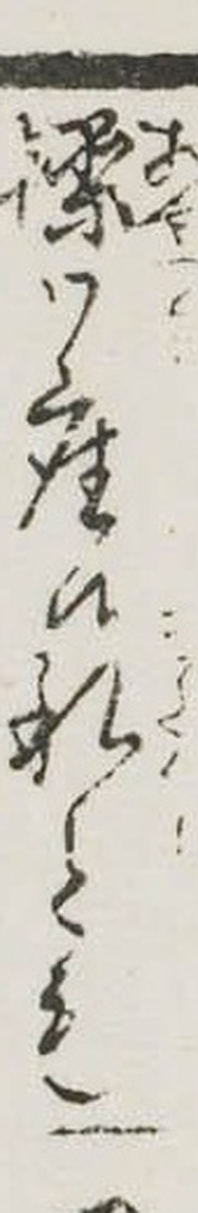操御座候私とも
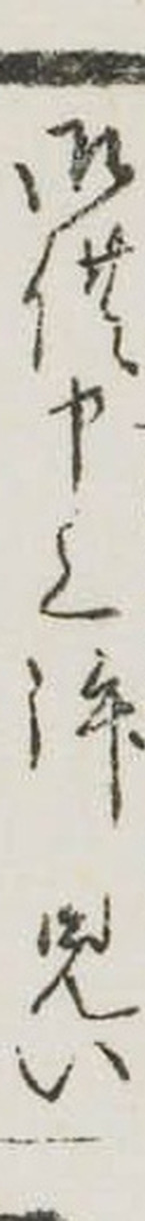御供申上拝見い
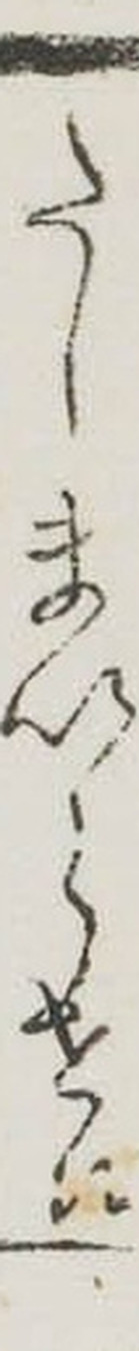たしまいらせ候
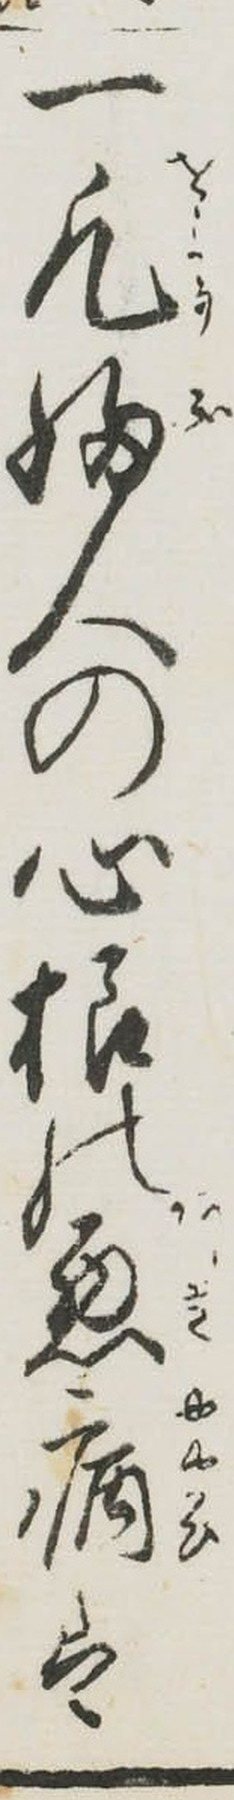一凡婦人の心根の悪病は
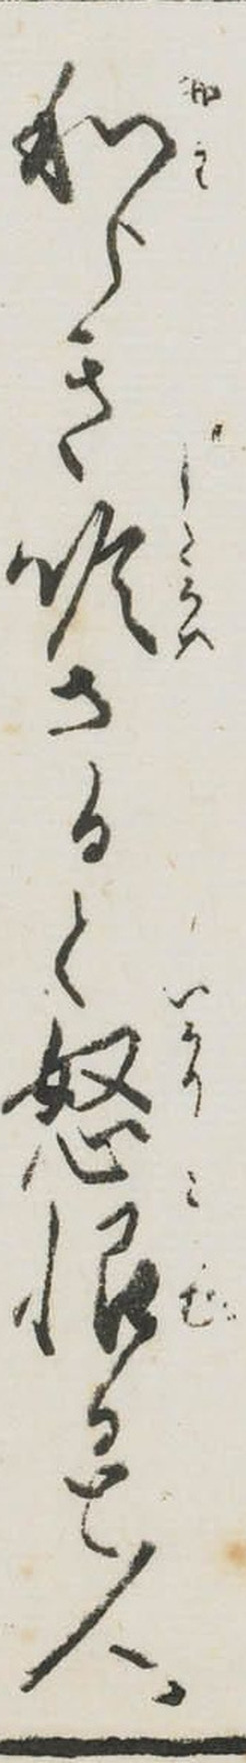和らき順さると怒恨ると人
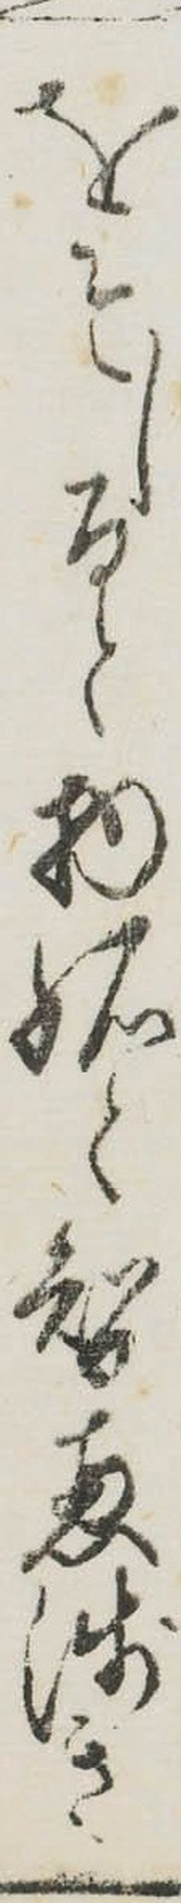をそしると物妬と智恵浅き
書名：女大学
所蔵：東京学芸大学教育コンテンツアーカイブ
